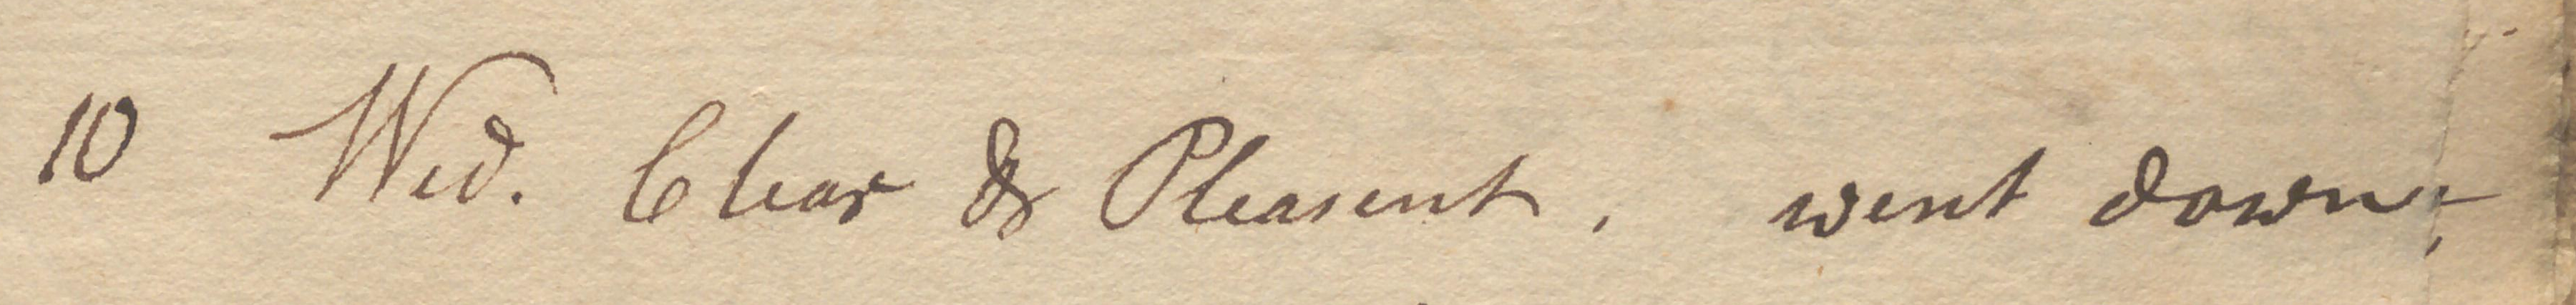10 Wed. Clear & Pleasent, went down
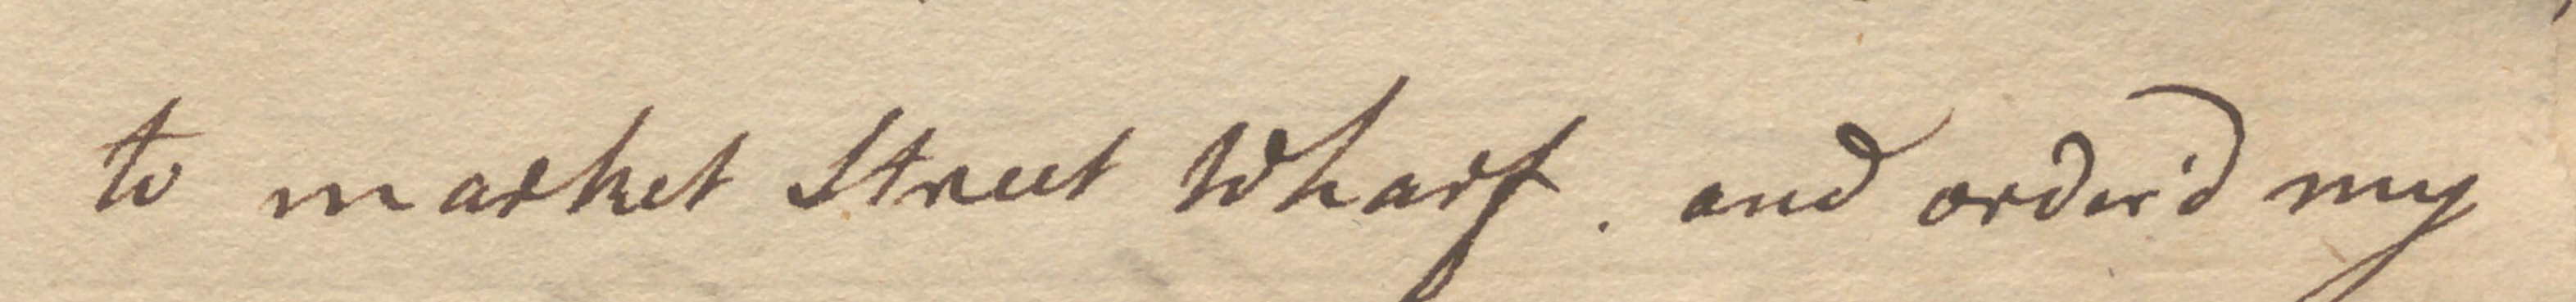to market Street wharf and order'd my
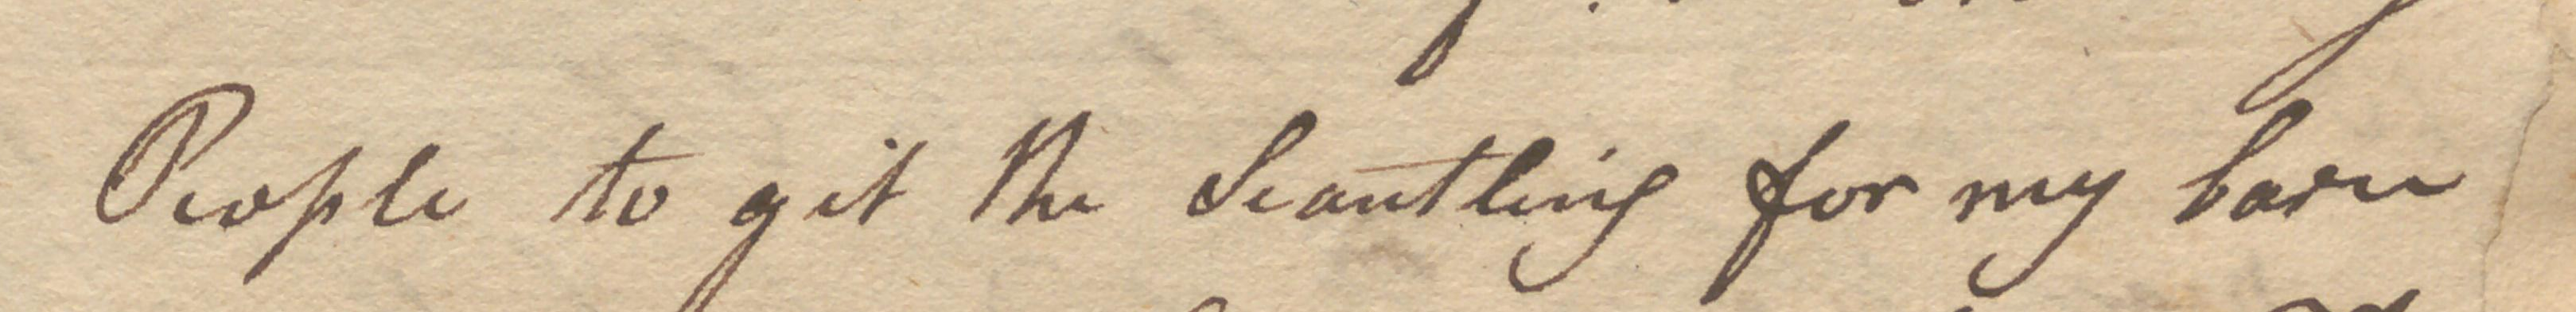People to git the Scantling for my barn
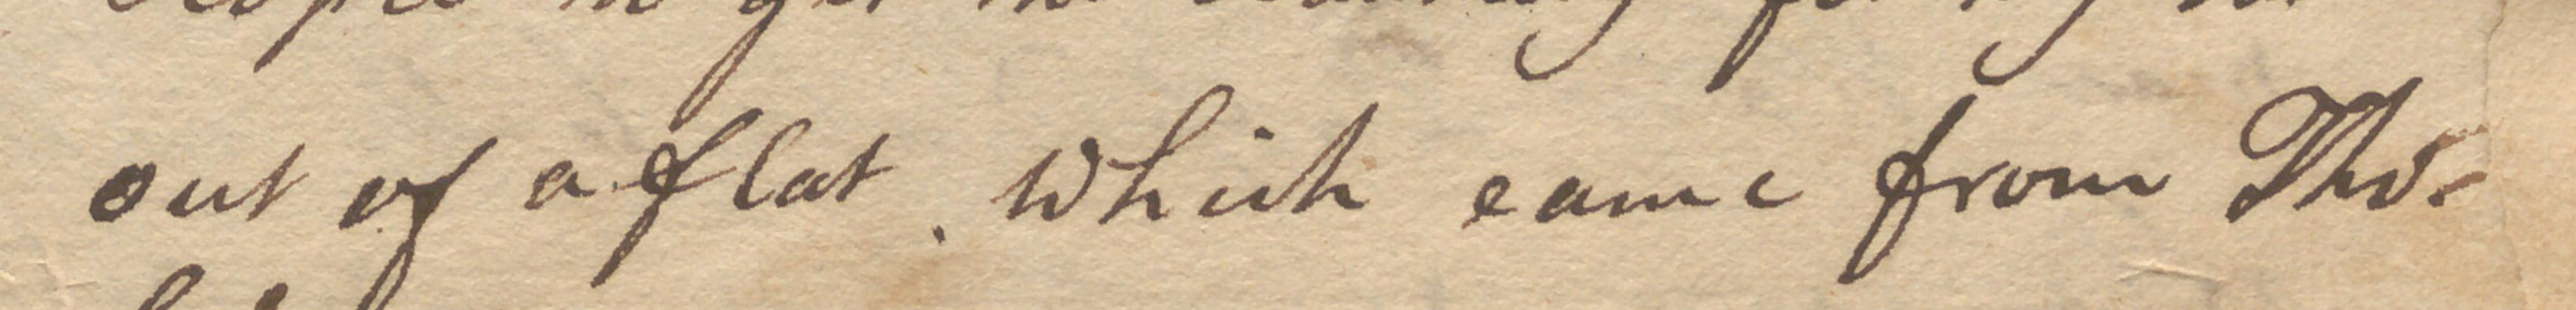out of a flat, which came from Tho^s.
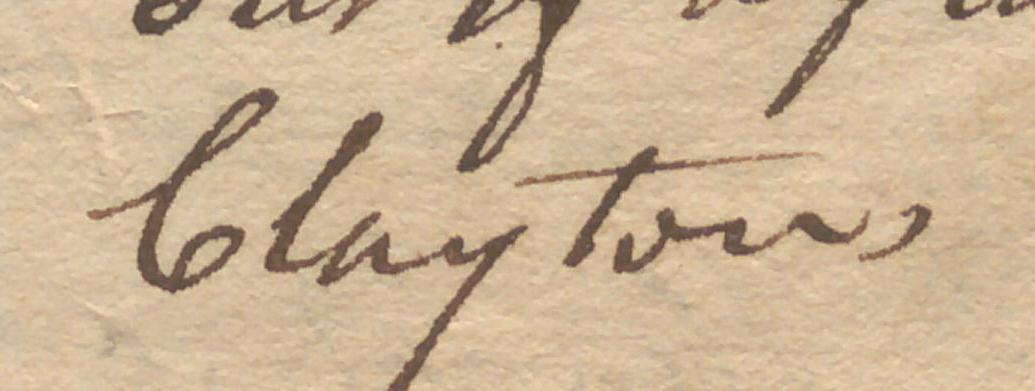Claytons
